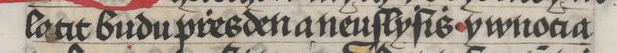latit budu pṙesden a neuſlyẛiṡ.y wnoci a
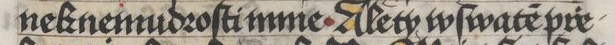neknemudroſti mnie.Alety wſwatē pṙe¬
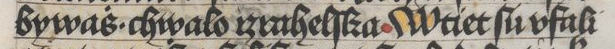bywaṡ.chwalo izrahelſka.Wtietſu ufali
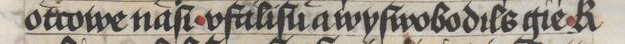otcowe naẛi.ufaliſu a wyſwobodils gie.K
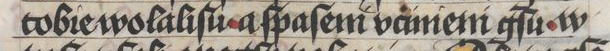tobie wolaliſu.a ſpaſeni uċinieni gſu.w
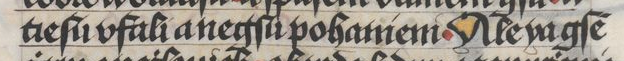tieſu ufali a negſu pohanieni.Ale ya gſē
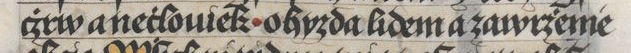cżrw a neċloviek.ohyzda lidem a zawrżeníe
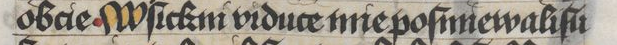obcie.Wẛickni viduce mie poſmiewaliſu
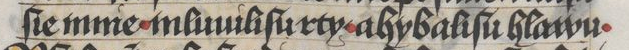ſie mnie.mluviliſu rty.ahybaliſu hlawu.
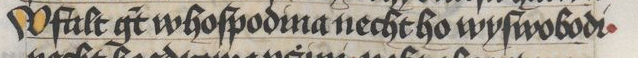Vfalt ḡt whoſpodina necht ho wyſwobodí.
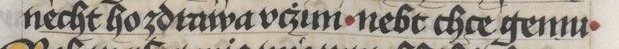necht ho zdrawa ucżini.nebt chce gemu.
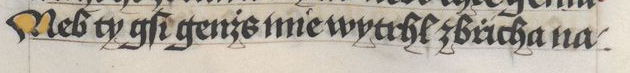Neg ty gſi genżs mie wytrhl zbṙicha na¬
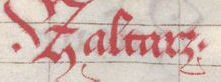.Żaltarz.
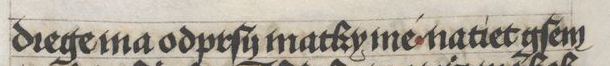diege ma odprſij matky mé.natiet gſem
